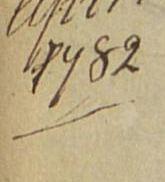1782
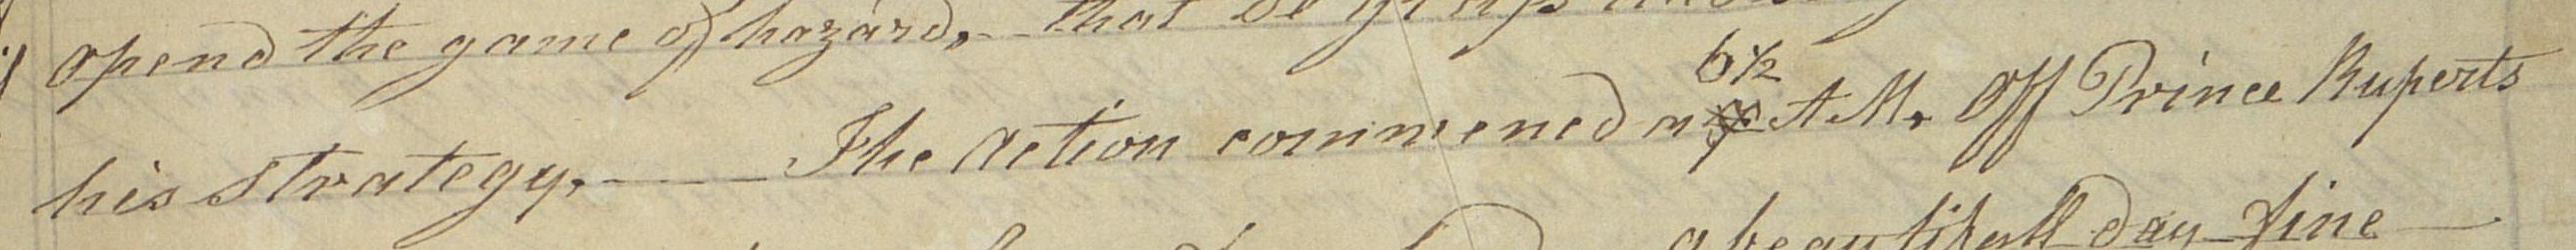his strategy. T he action commenced a 7 A. M. Off Prince Ruperts
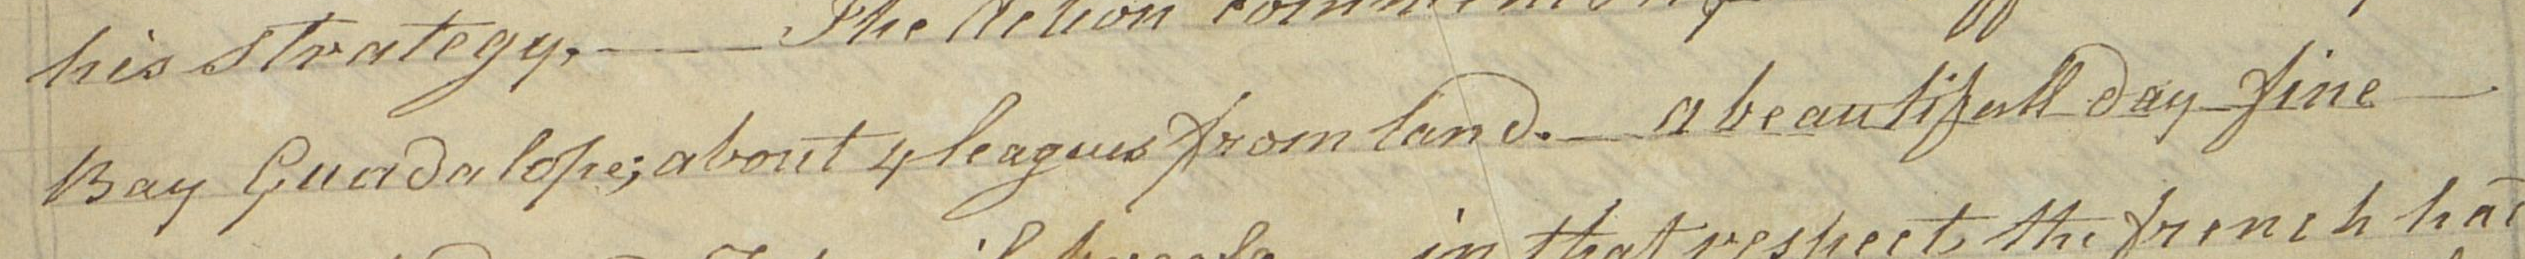Bay Guadalope; about 4 leagues from land. A beautifull day fine
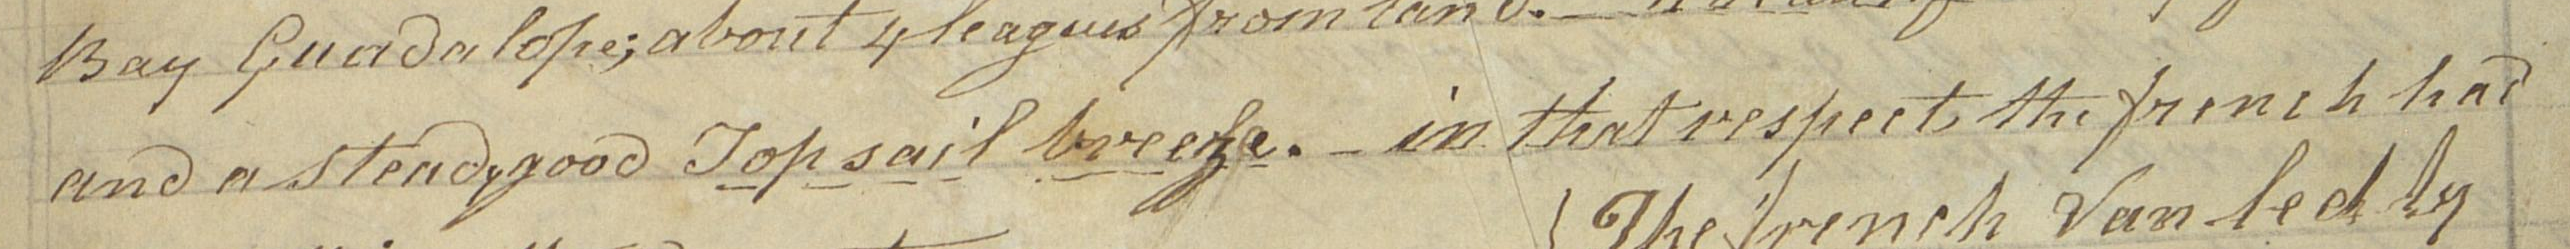and a steady good Topsoil breeze. in that respect the french had
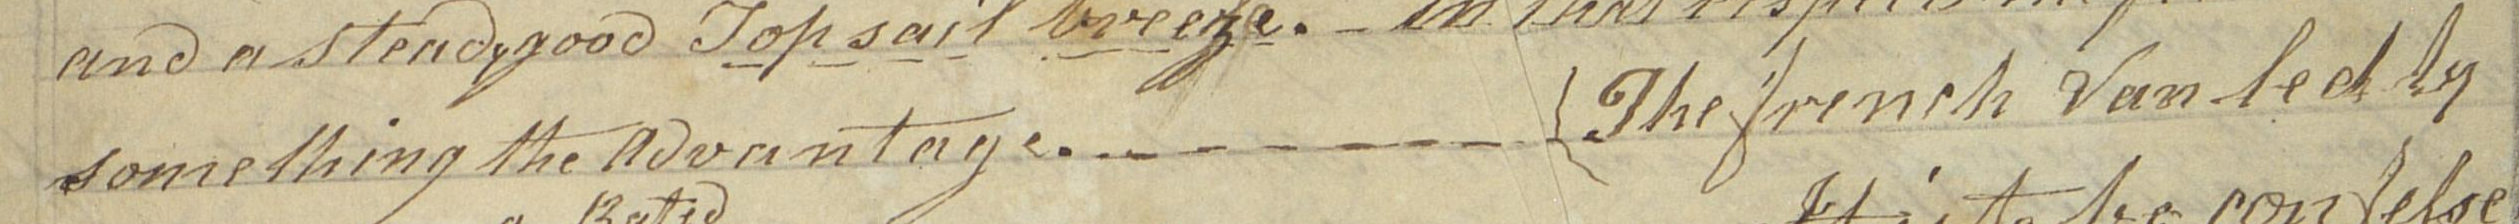something the advantage. (The french Van led by
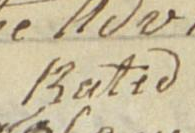Rated
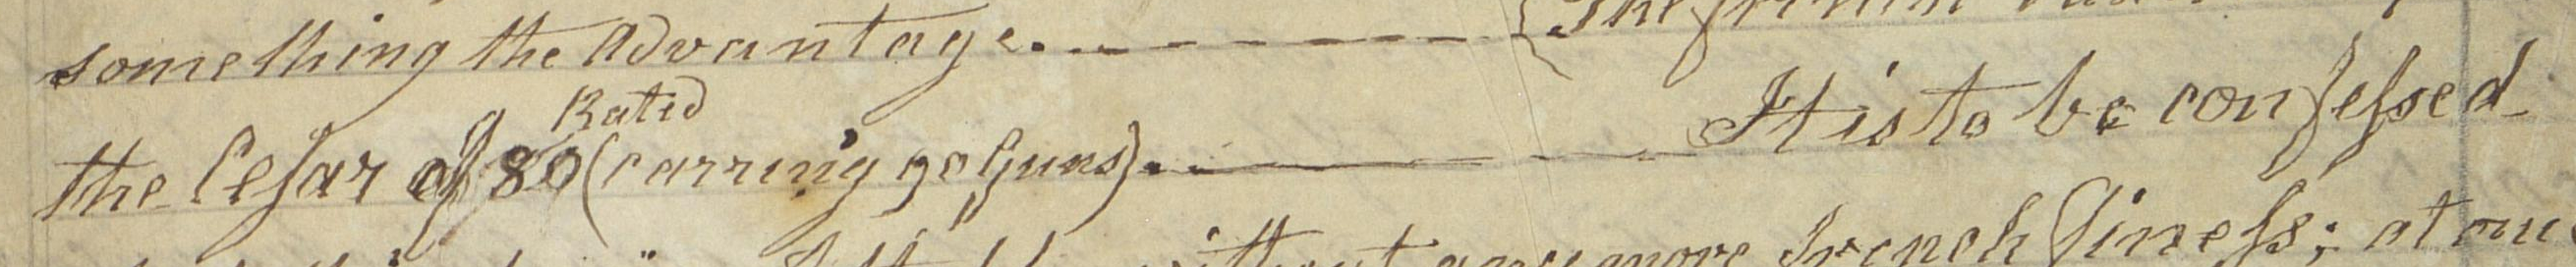the Cesar of 80 ^ (carring 90 Guns). It is to be confessed
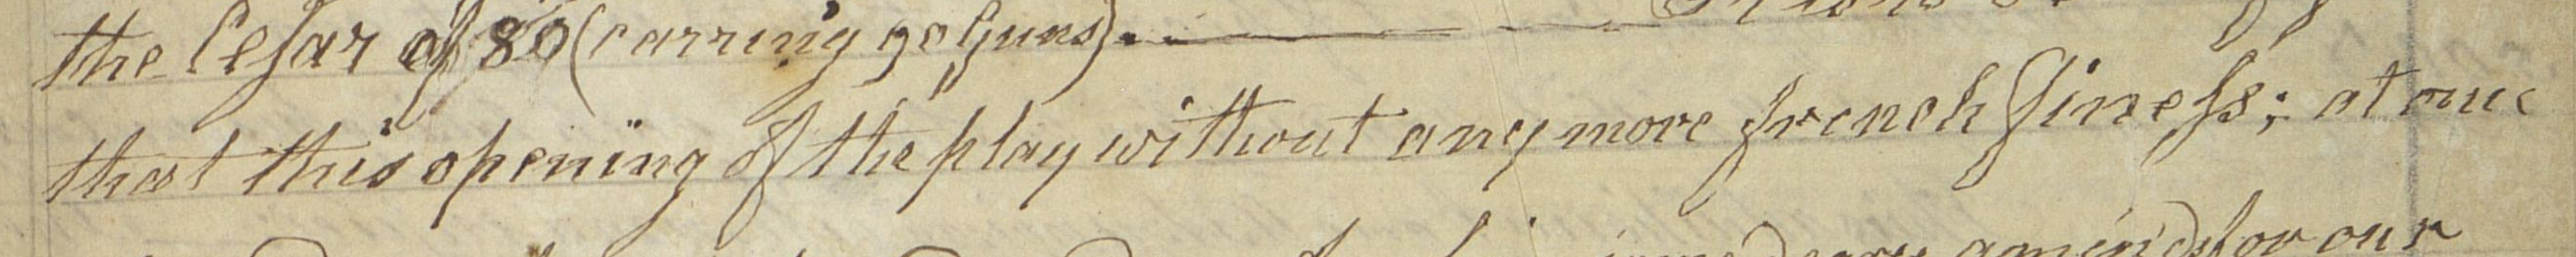that this opening of the play without any more french finess; at once
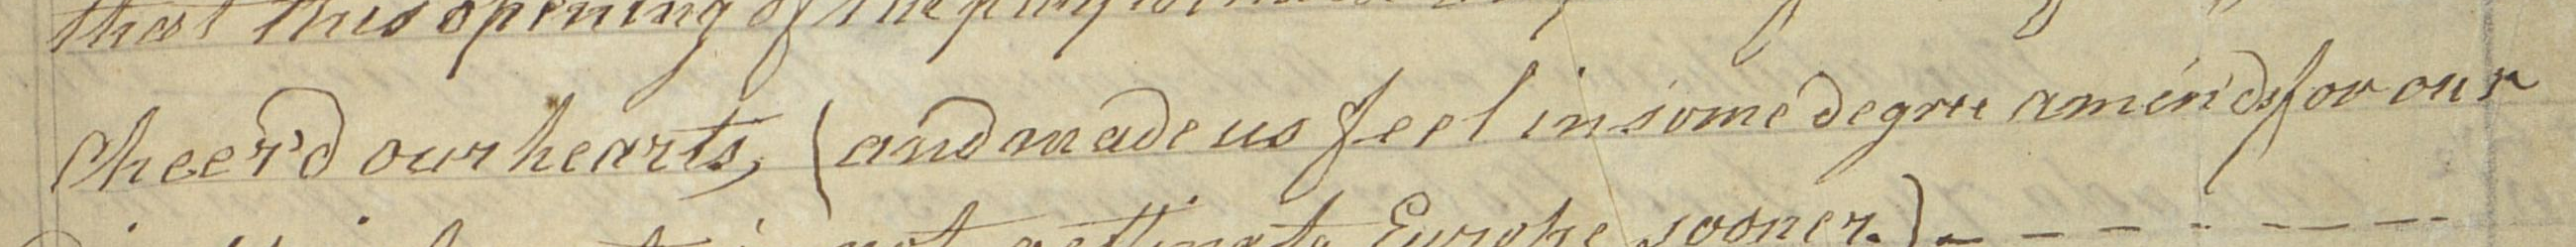cheer'd our hearts, (and made us feel in some degree amend for our
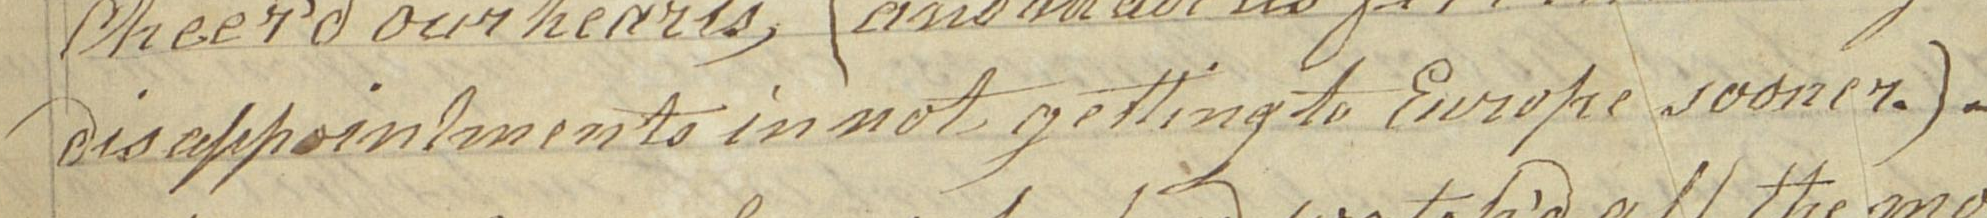disappointments in not getting to Europe sooner.)
